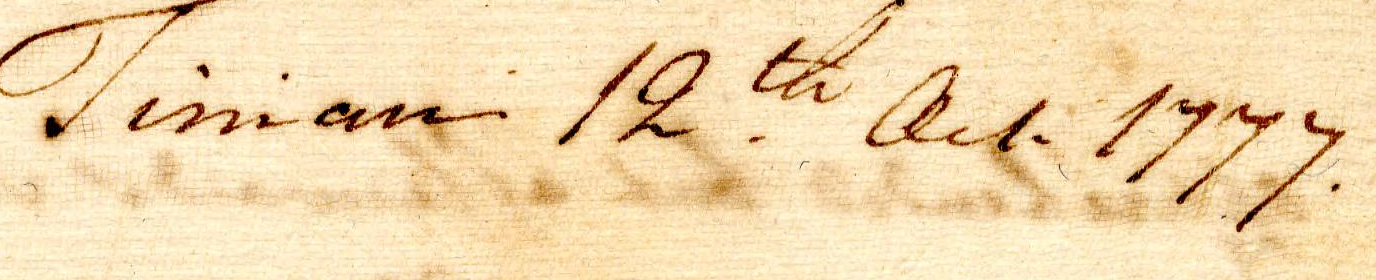Tinian 12^th. Oct. 1777.
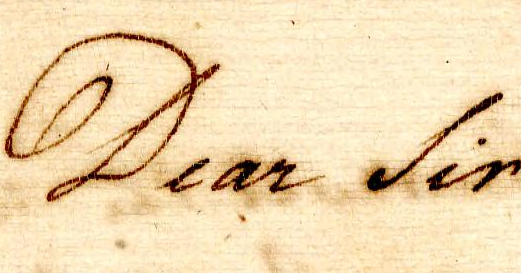Dear Sir
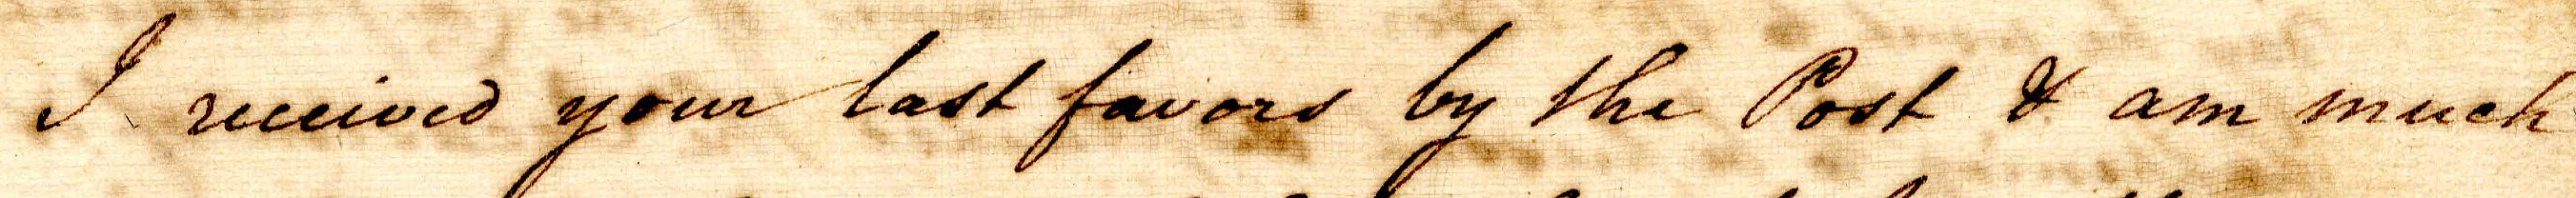I received your last favors by the Post & am much
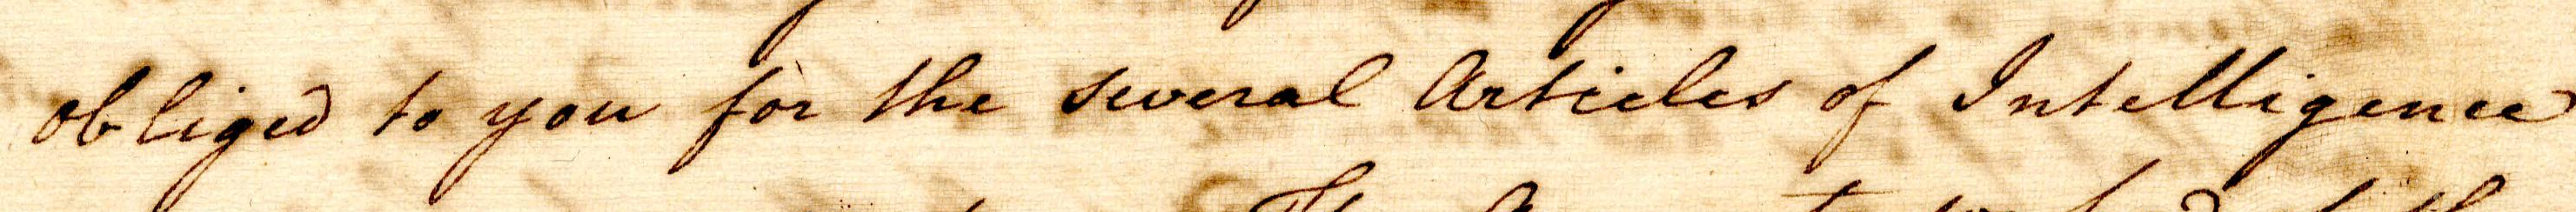obliged to you for the several Articles of Intelligence
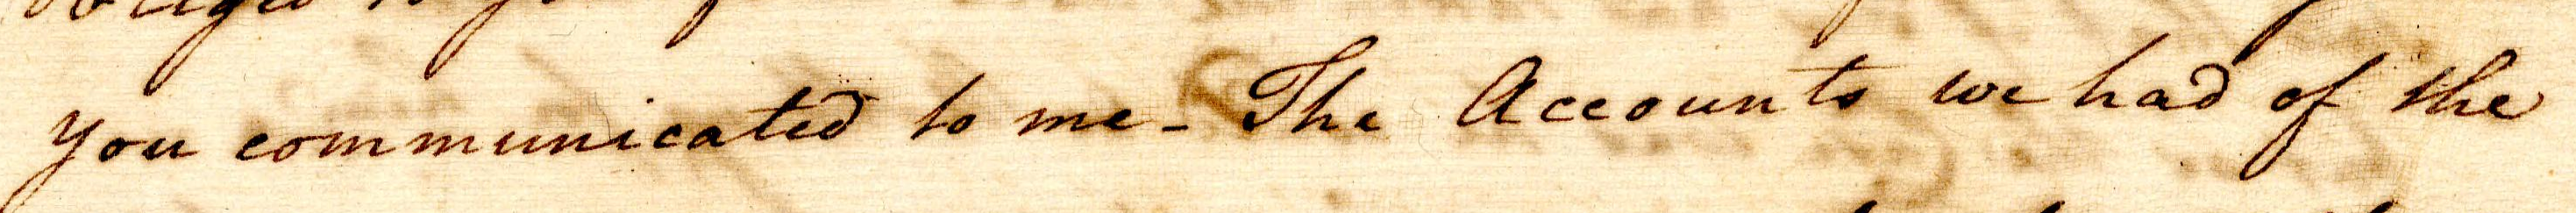you communicated to me- The Accounts we had of the
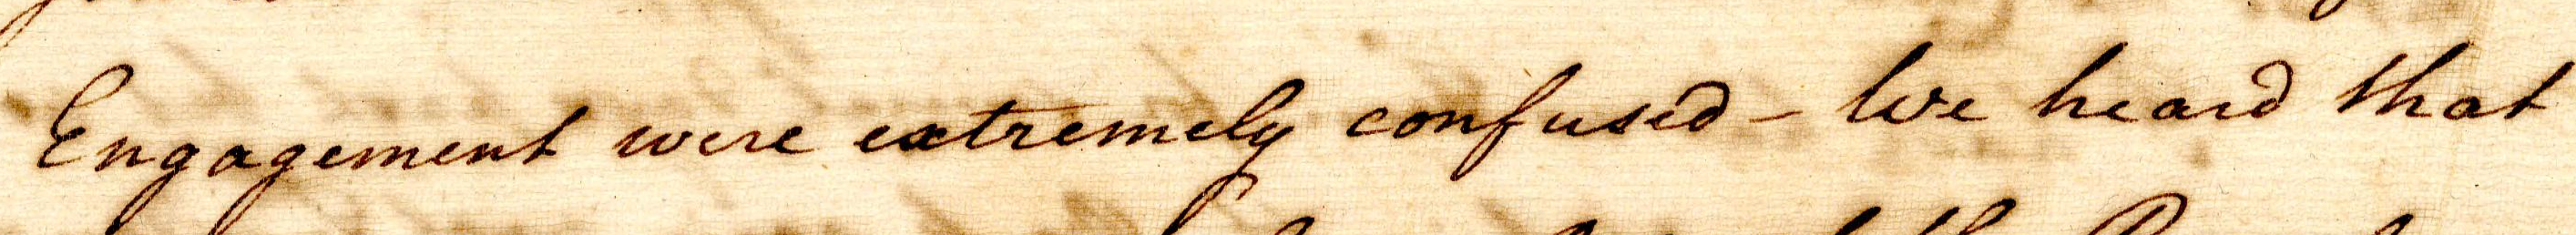Engagement were extremely confused- We heard that
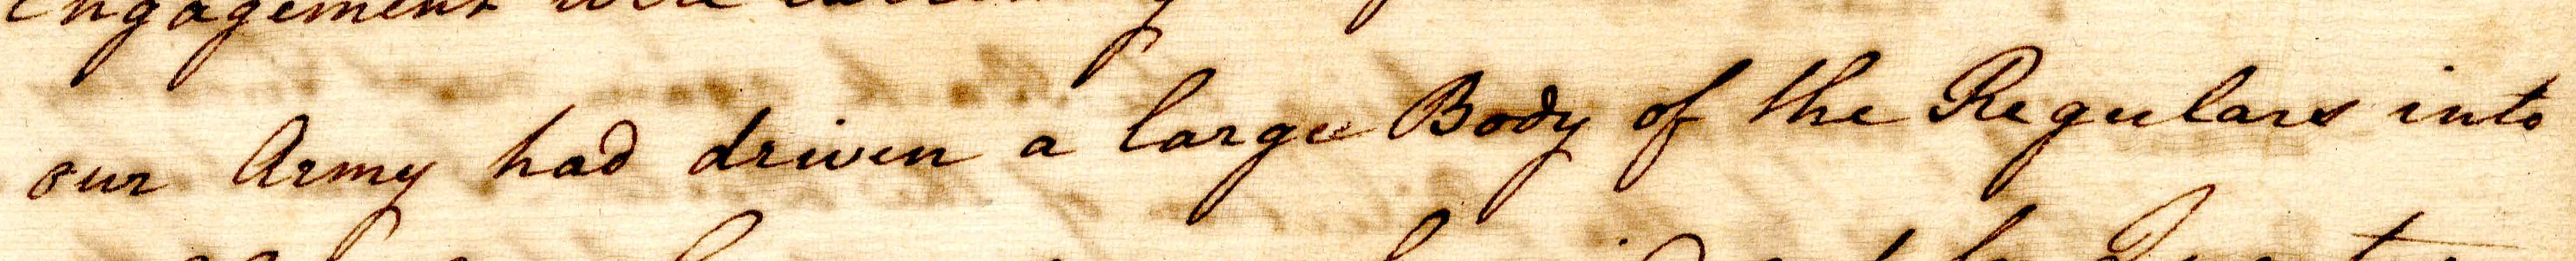our Army had driven a large Body of the Regulars into
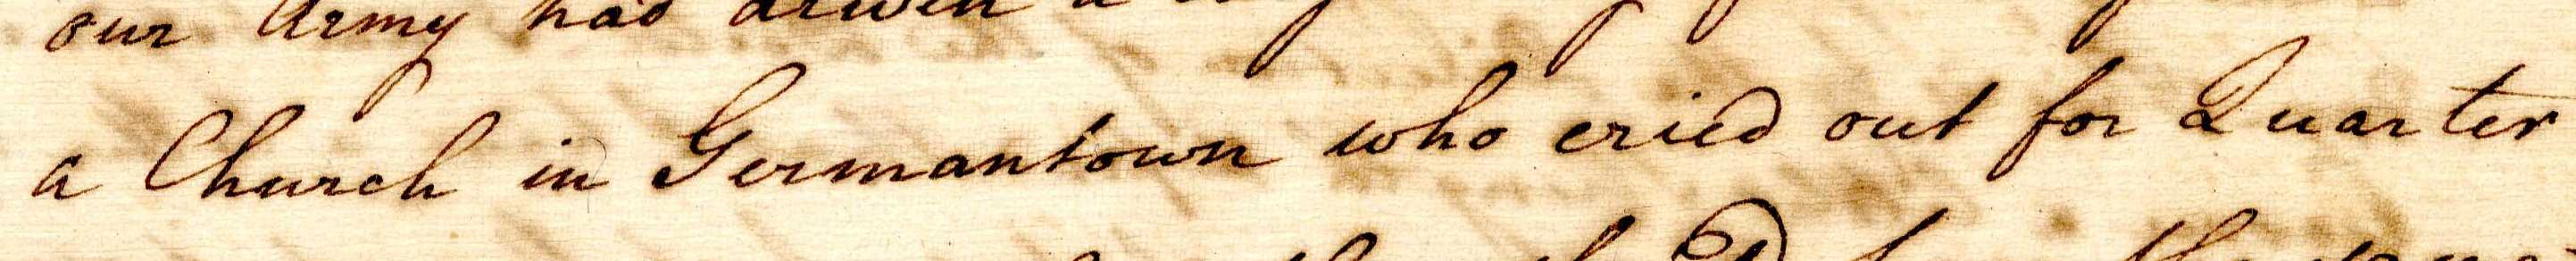a Church in Germantown who cried out for Quarter
